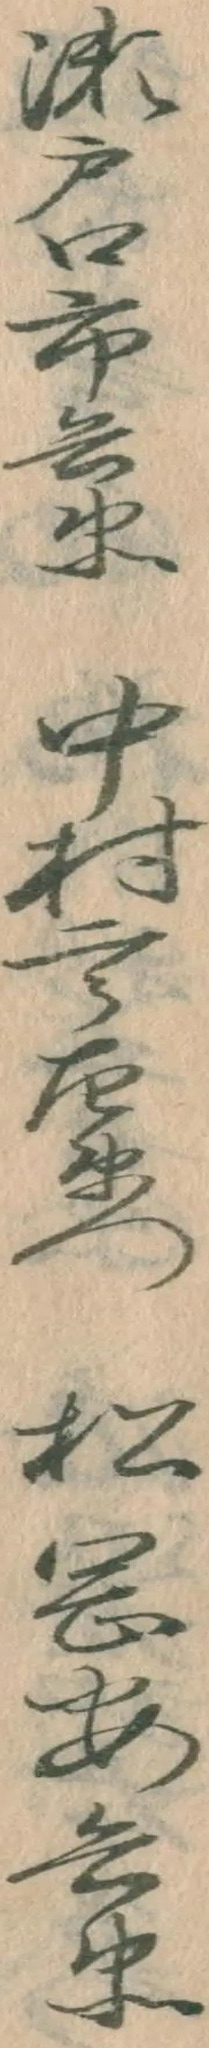瀬戸口市兵衛中村二郎左衛門松岡安兵衛
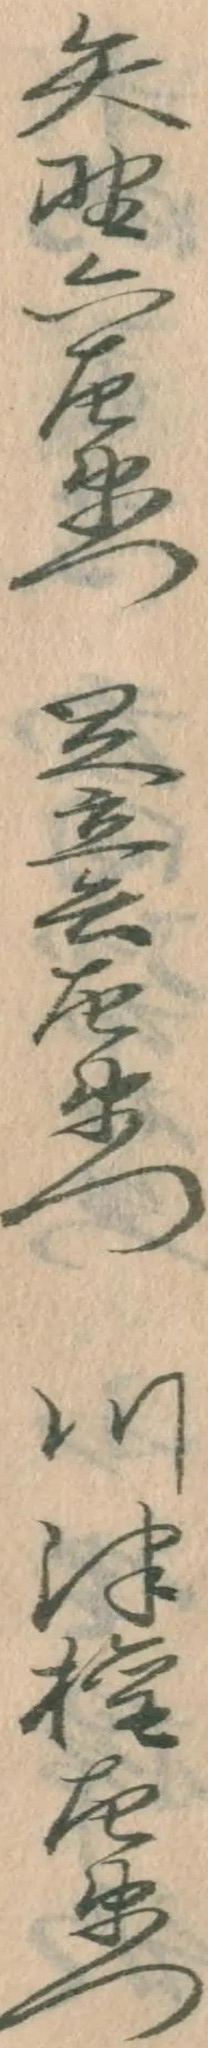矢野六左衛門足立兵左衛門川津権左衛門

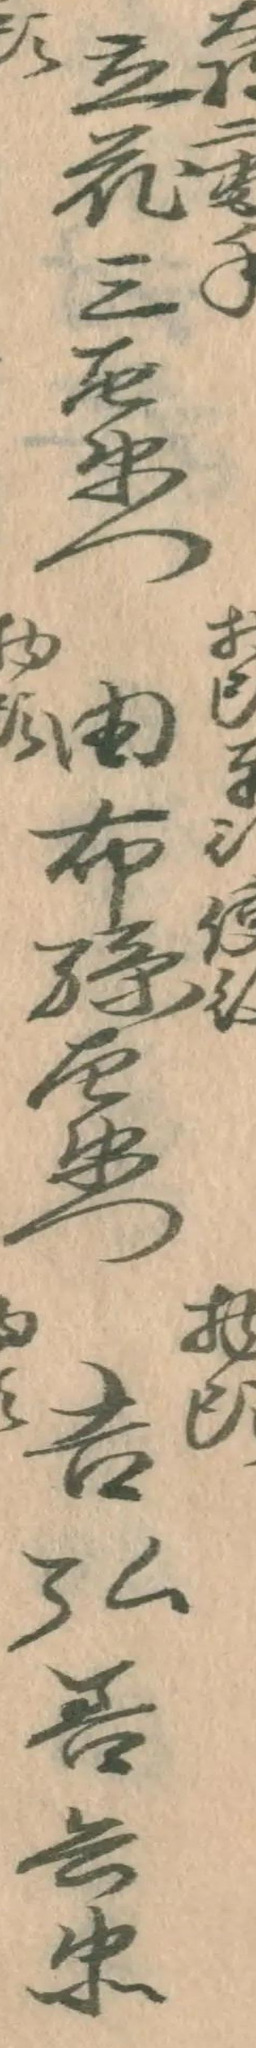立花三左衛門由布孫左衛門吉広善兵衛
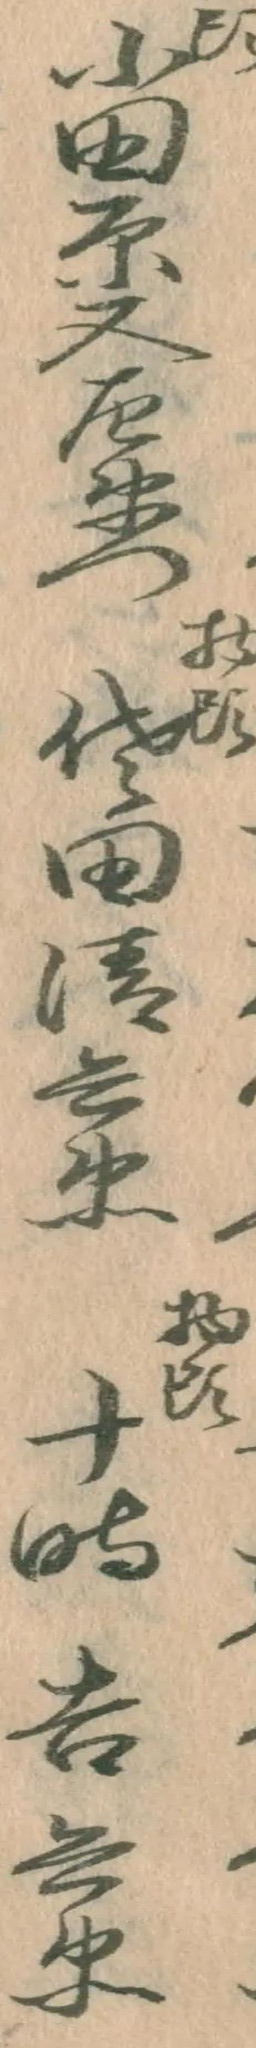小田原又左衛門佐田清兵衛十時吉兵衛
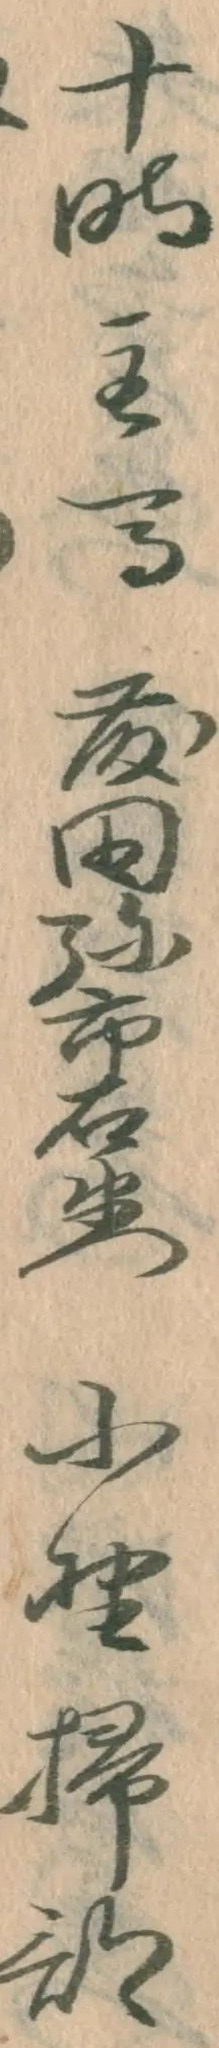十時主馬藤田弥市右衛門小野掃部
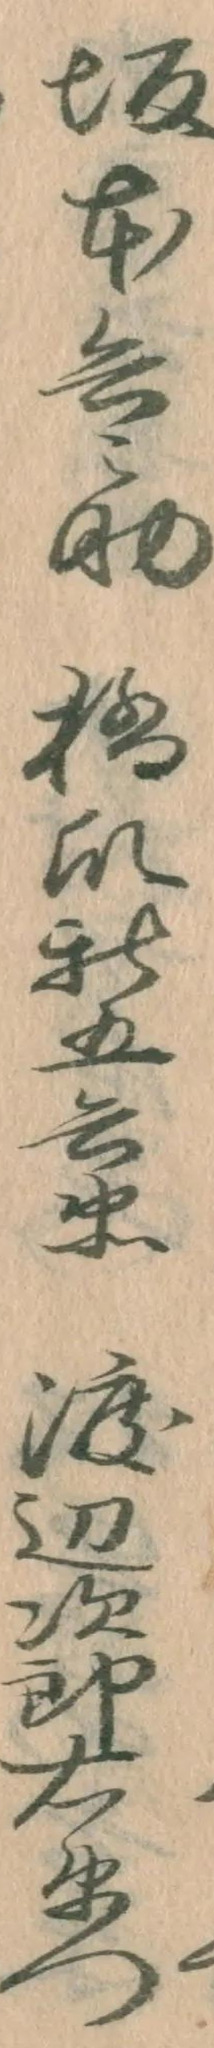坂本兵之助橋爪新五兵衛渡辺次郎右衛門
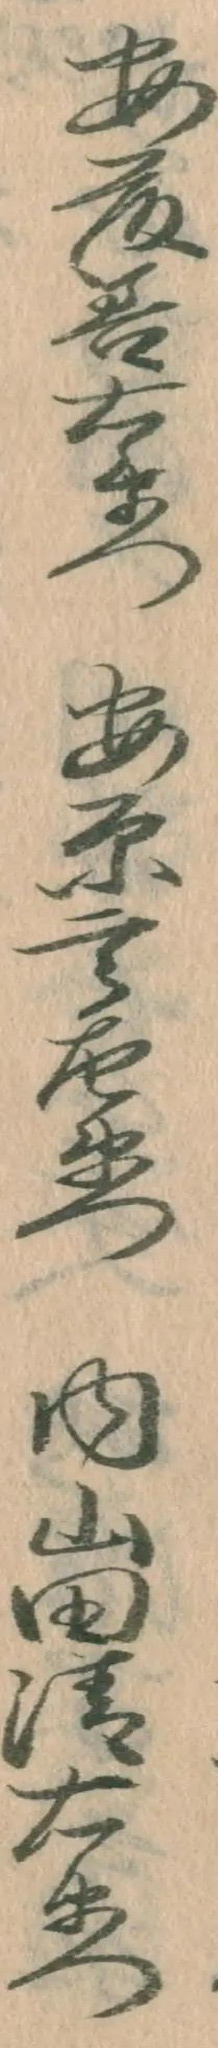安藤善右衛門安原二郎左衛門内山田清右衛門
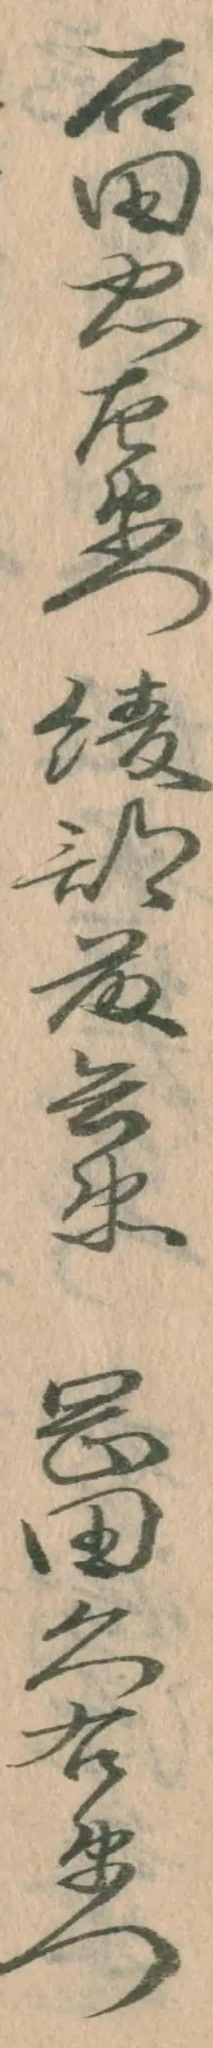石田忠左衛門綾部藤兵衛岡田久右衛門
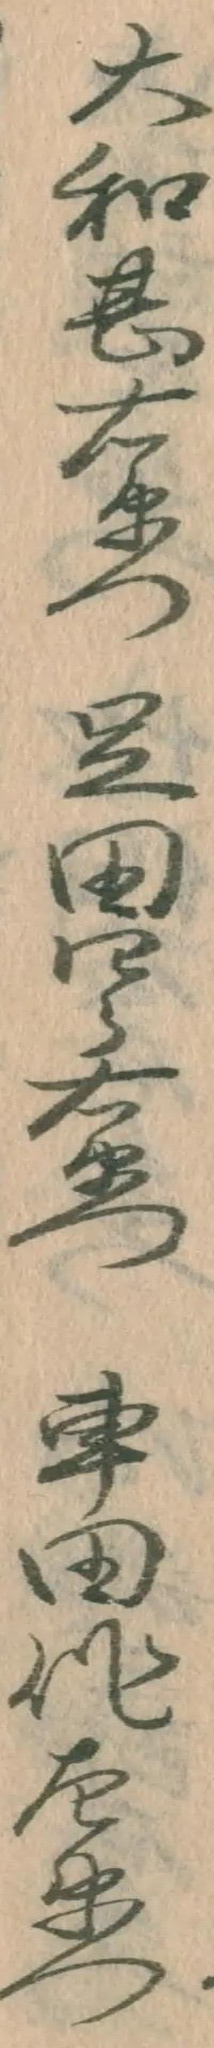大和甚右衛門足田四郎右衛門車田作左衛門
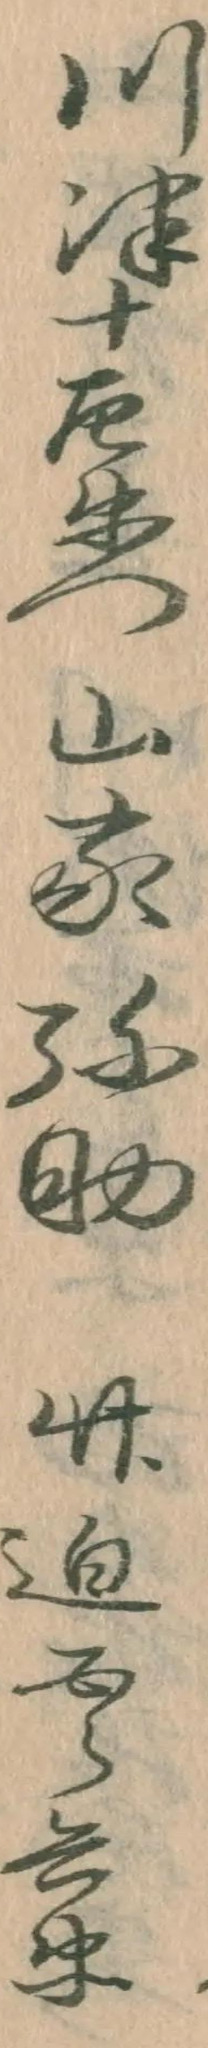川津十左衛門山家弥助竹迫五郎兵衛
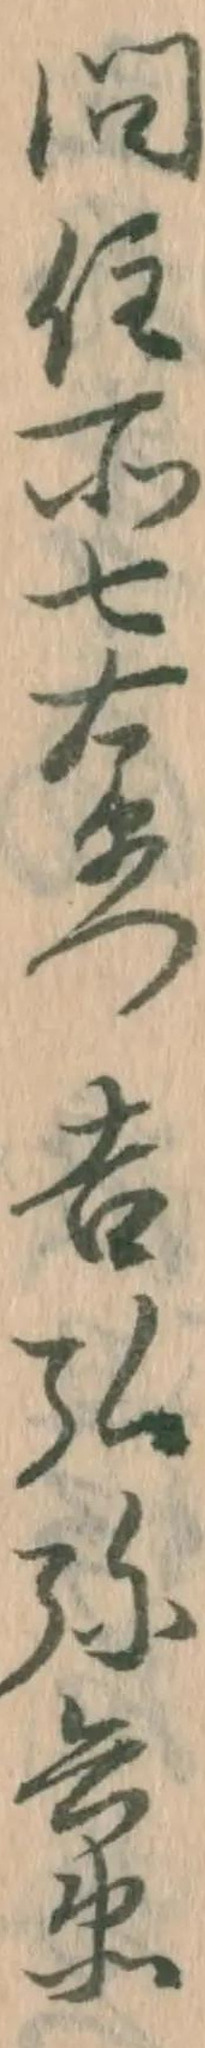問住所七右衛門吉弘弥兵衛
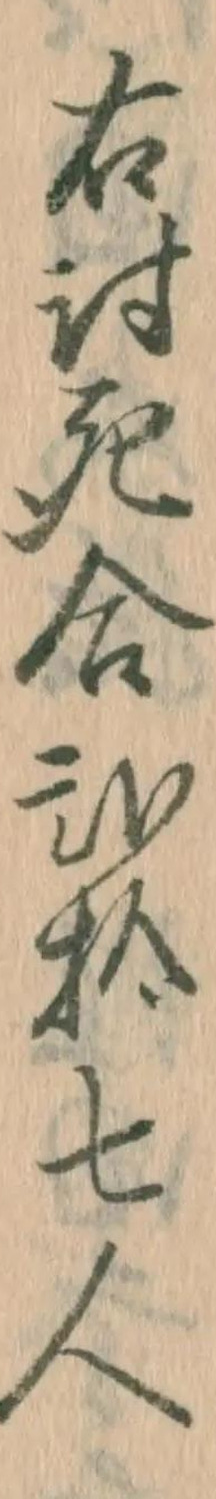右討死合弐拾七人
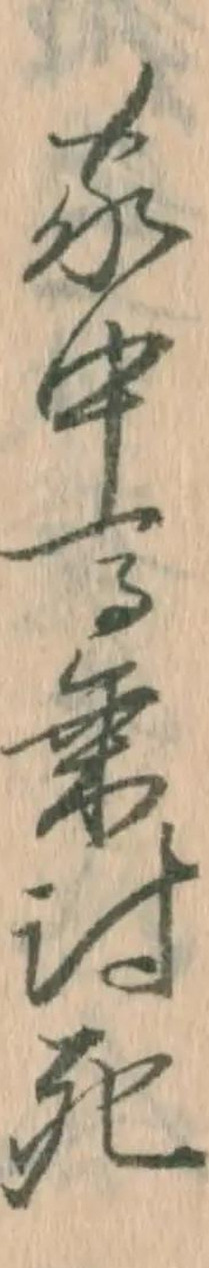家中馬乗討死
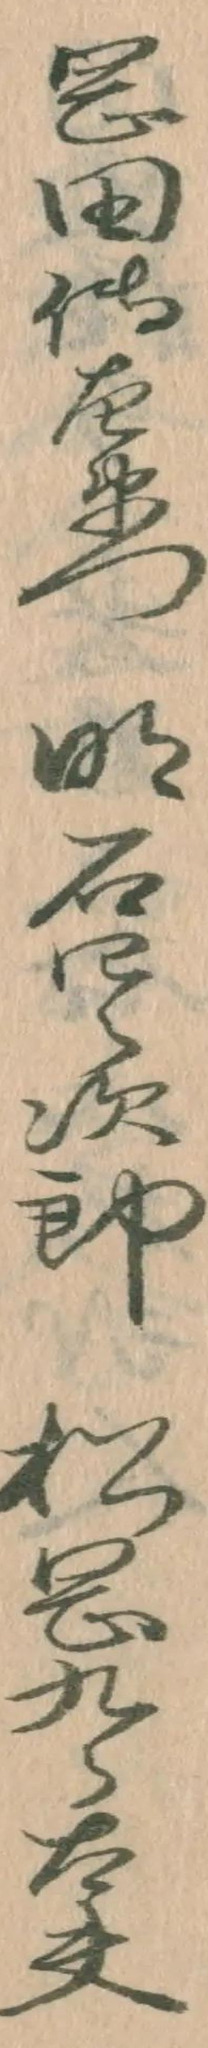岡田伝左衛門明石四郎次郎松岡九郎太夫
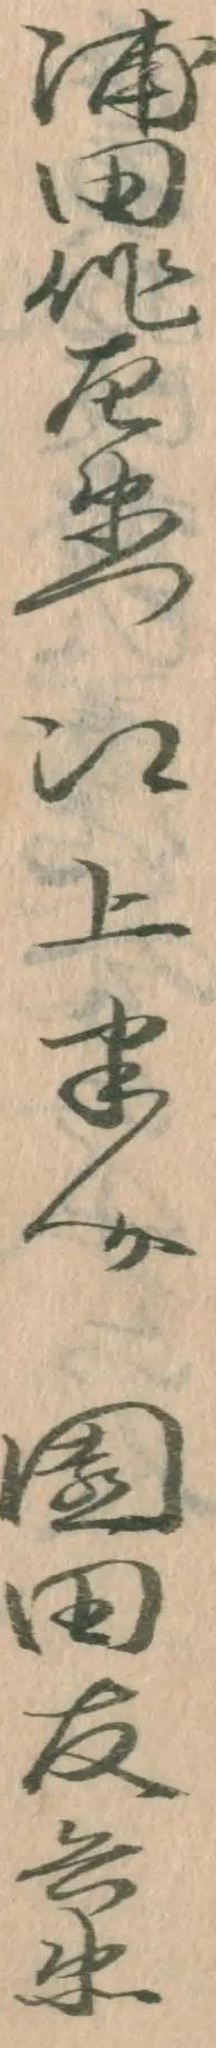浦田作左衛門江上半介園田友兵衛
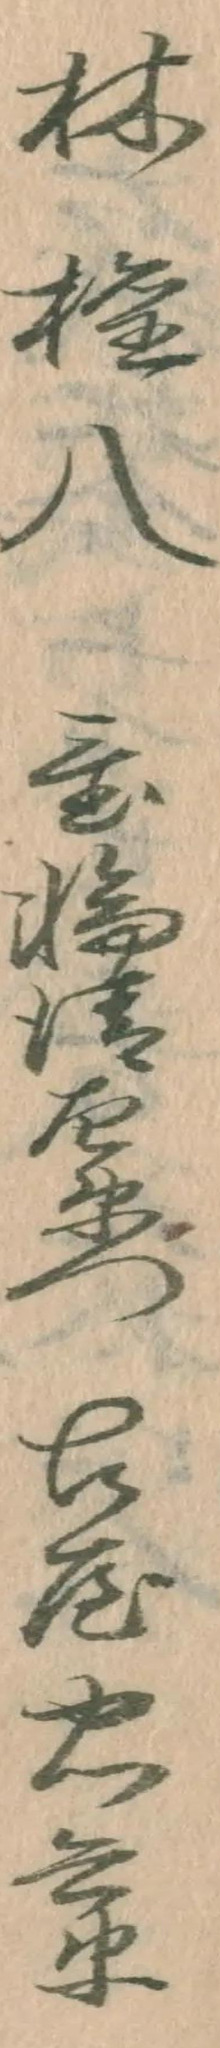林権八置輪清左衛門古屋忠兵衛
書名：切支丹御退治記 49巻. [9]
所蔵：国立国会図書館 National Diet Library, JAPAN
